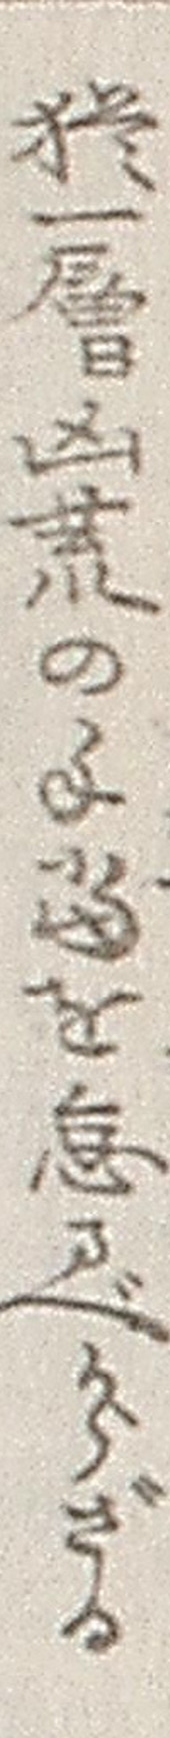猶一層凶荒の手当てを怠るべからざる
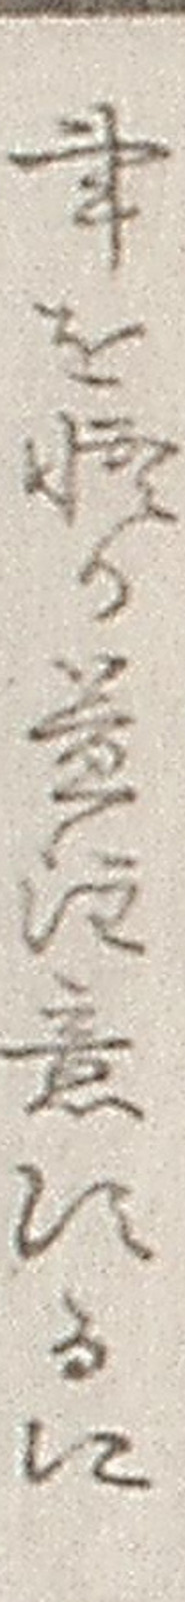事を悟り益注意するに
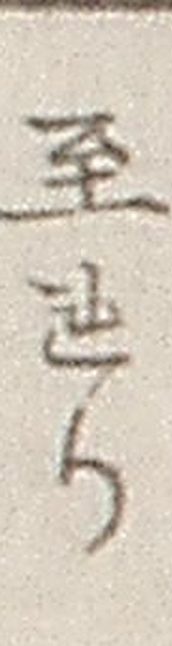至れり

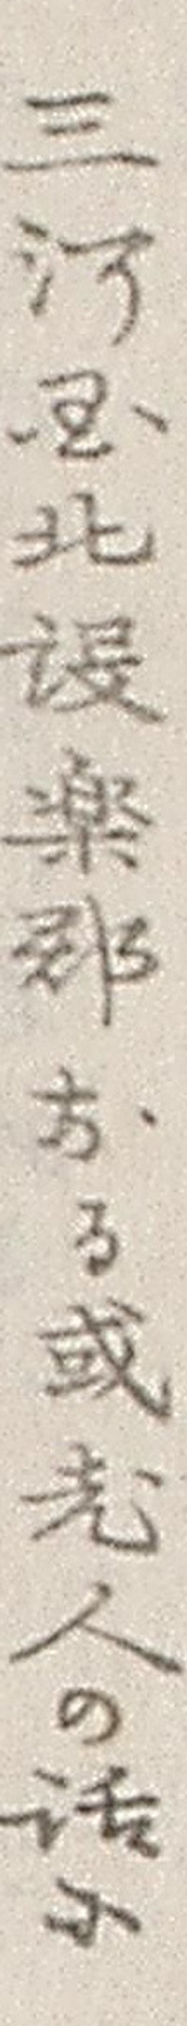三河国北設楽郡なる或老人の話に
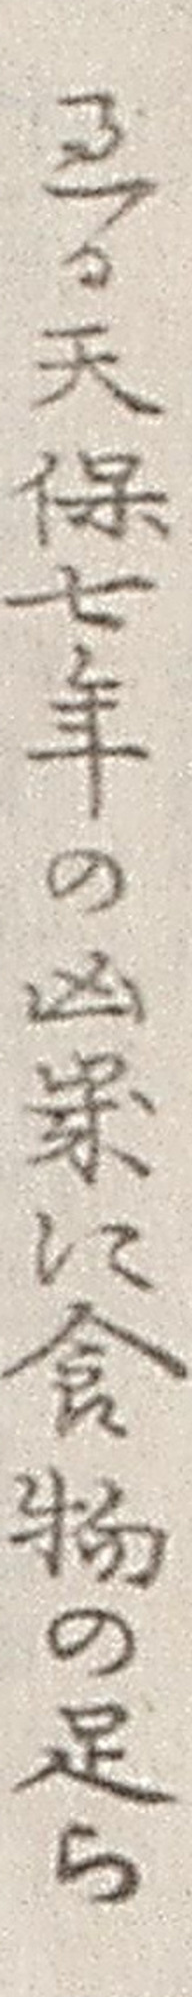過る天保七年の凶歳に食物の足ら
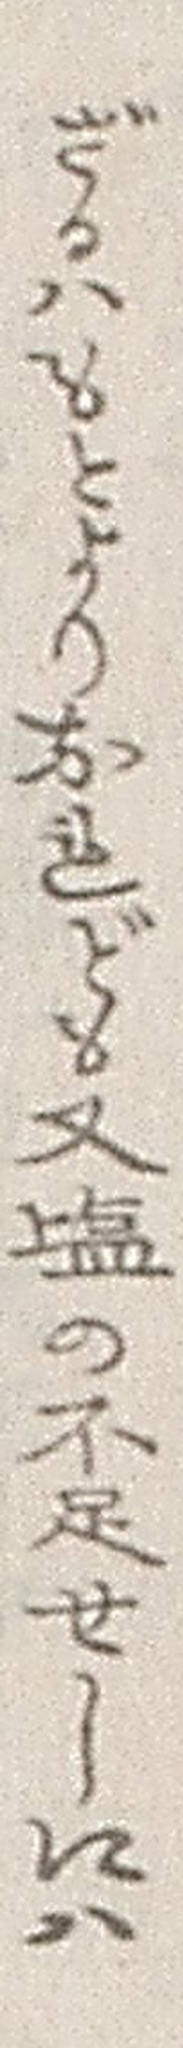ざるはもとよりなれども又塩の不足せしには
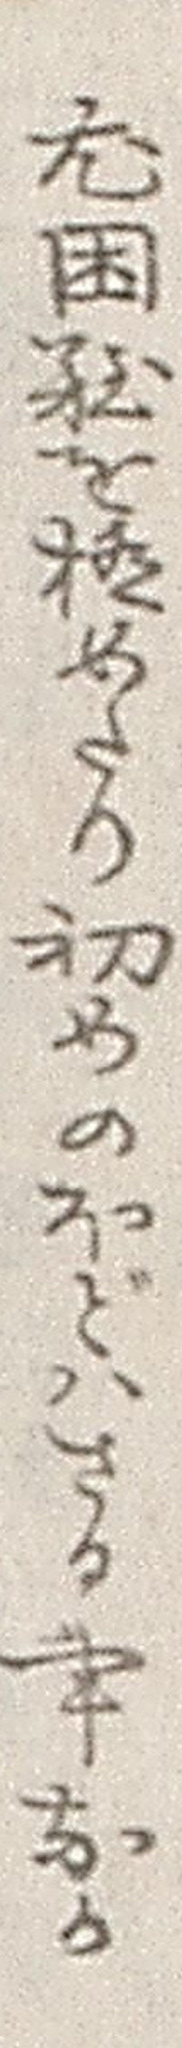尤困難を極めたり初めのほどはさる事なか
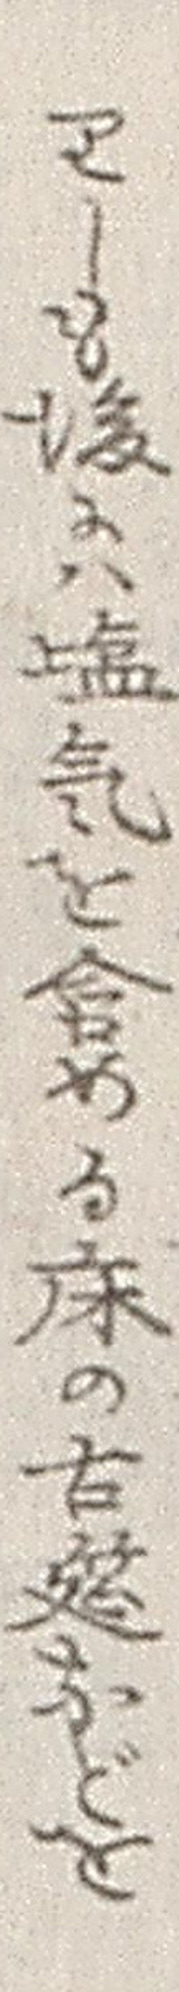りしも後には塩気を含める床の古筵などを
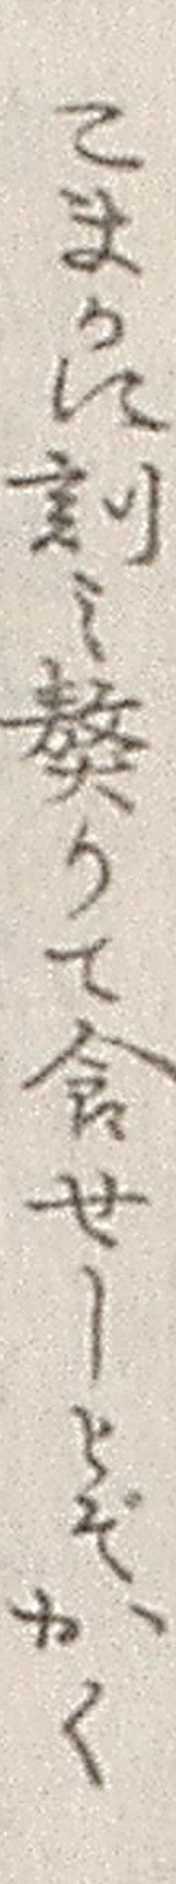こまかに刻み熬りて食せしとぞかく
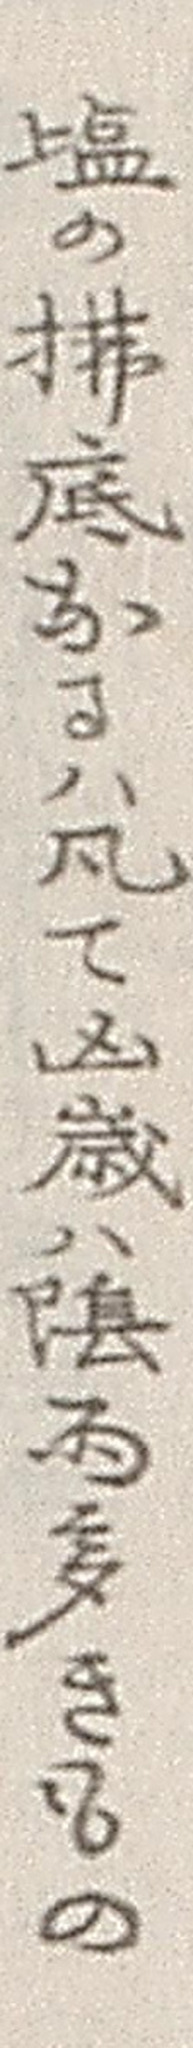塩の拂底なるは凡て凶歳は陰雨多きもの
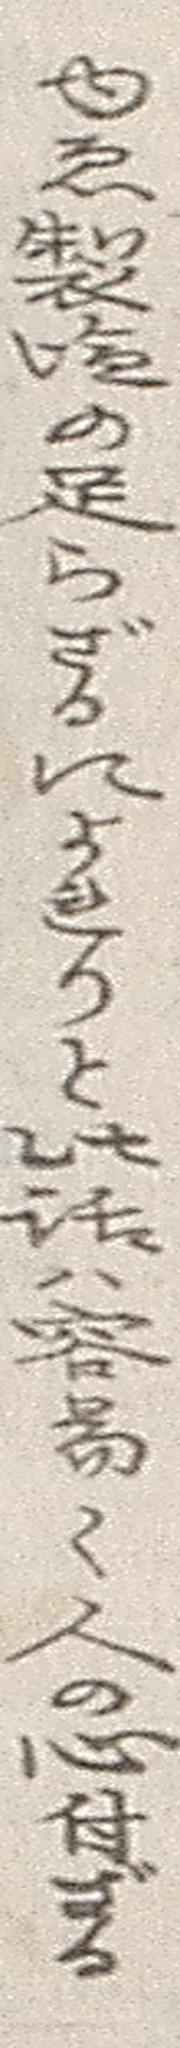ゆゑ製塩の足らざるによりと此話は容易く人の心付ざる
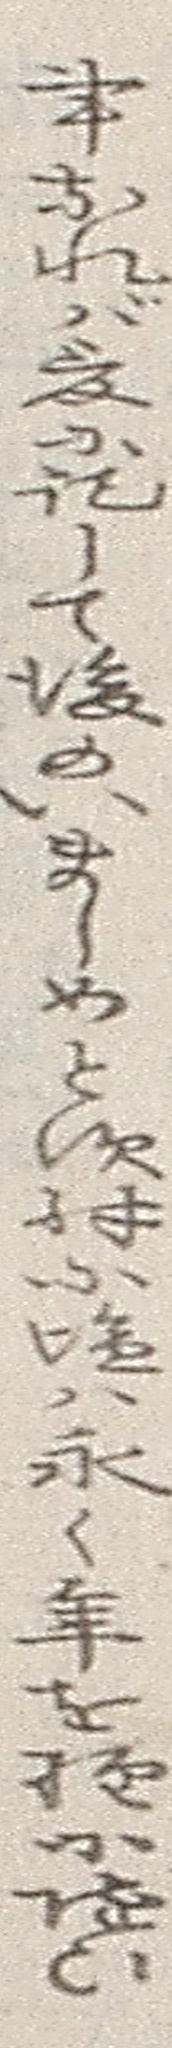事なれば爰に記して後のいましめとす殊に塩は永く年を経るに従ひ
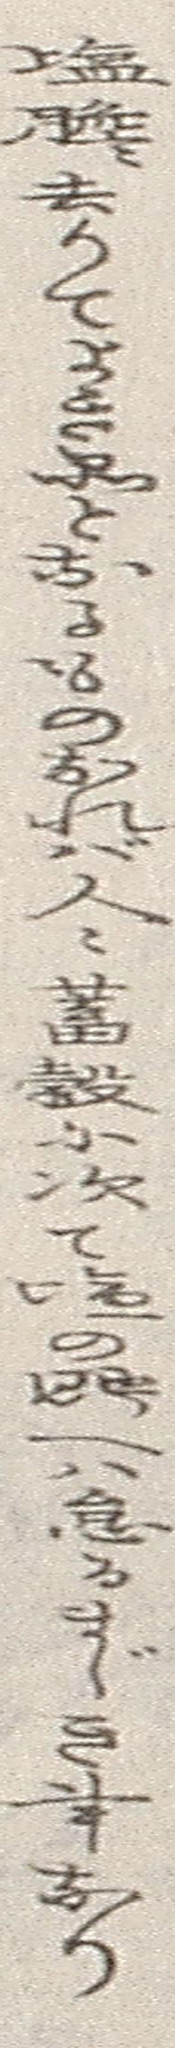塩膽去りてよき品となるものなれば人々蓄穀に次て塩の貯へは怠るまじき事なり

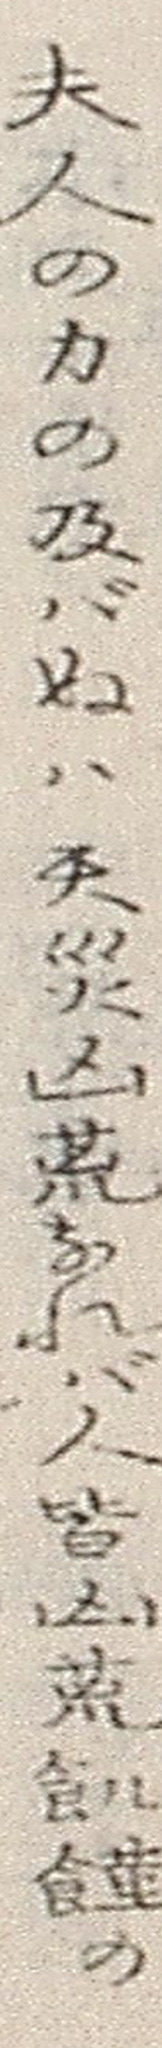夫人の力の及ばぬは天災凶荒なれば人皆凶荒飢饉の
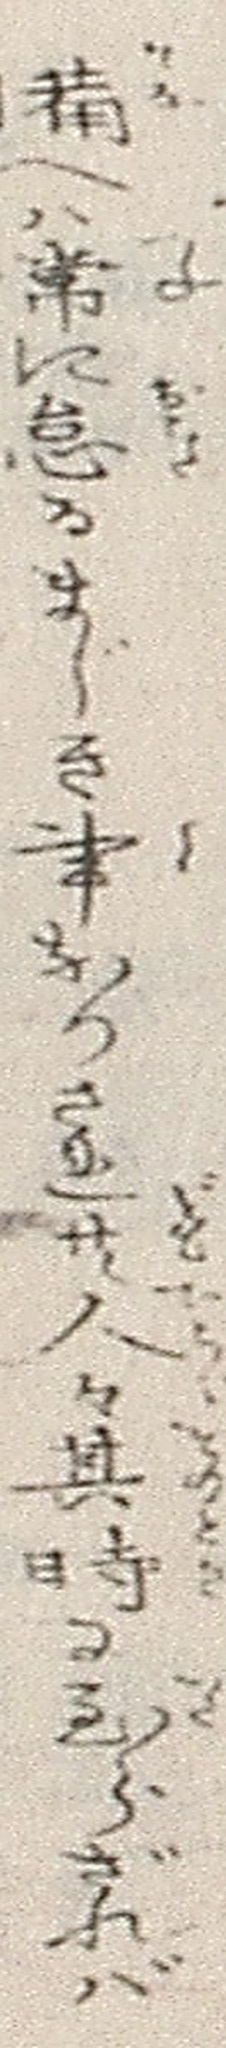備へは常に怠るまじき事なりされ共人々其時に至らざれば
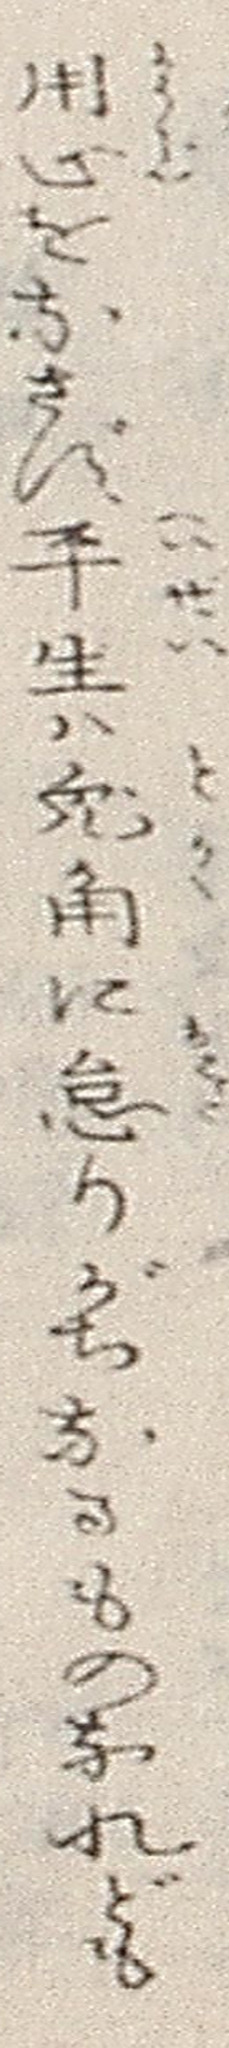用心をなさず平生は兎角に怠りがちなるものなれども
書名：凶荒図録　完
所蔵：東京大学地震研究所図書室 Earthquake Research Institute Library, The University of Tokyo, JAPAN
